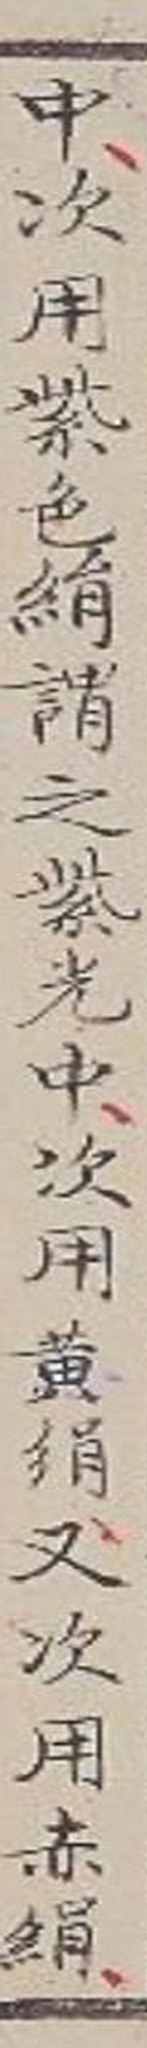中、次用紫色絹謂之紫光中、次用黃絹、又次用赤絹、
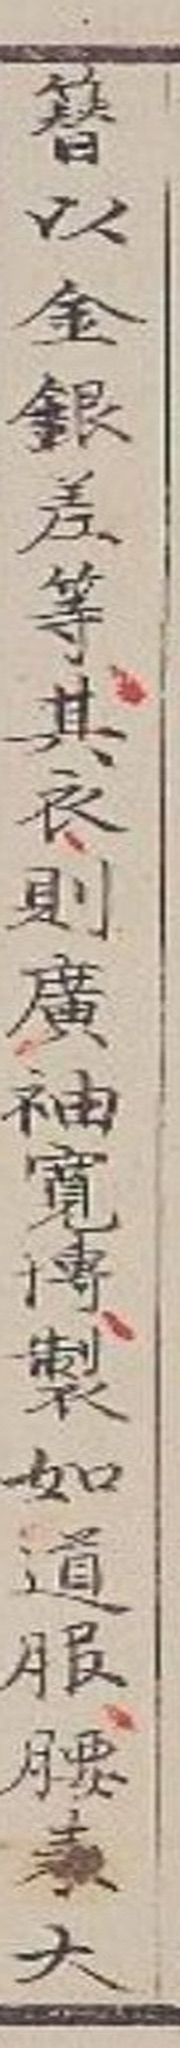簪以金銀差等、其衣、則広袖寛博、製如道服、腰大
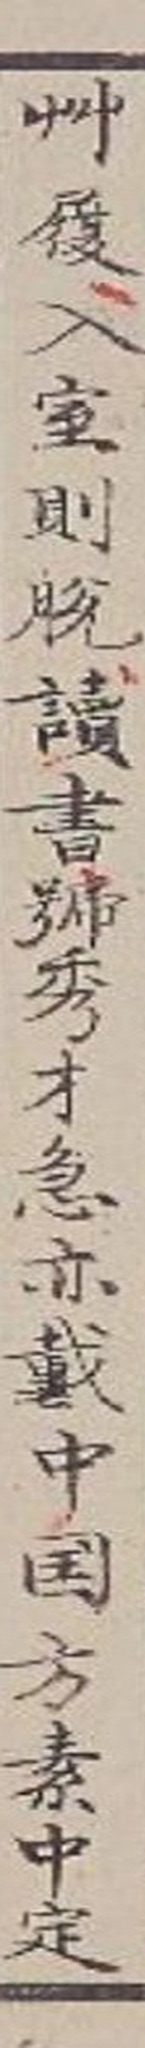草履、入室則脱、読書号秀才急亦戴中国方素中定
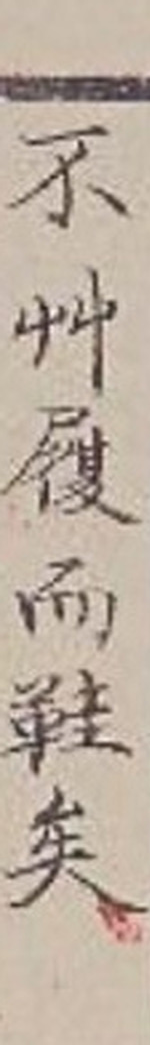不草履而鞋矣、
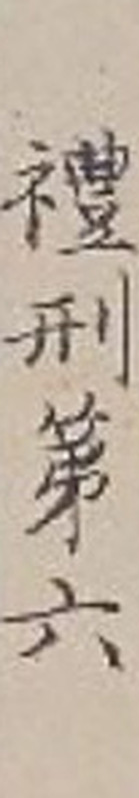礼刑第六
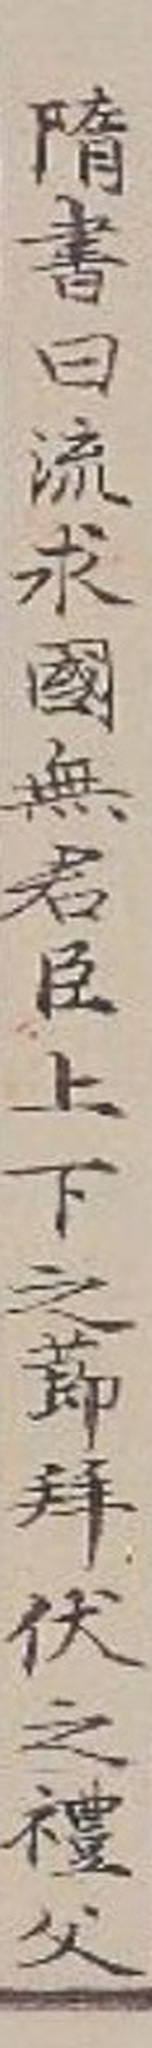隋書曰流求国無君臣上下之莭拝伏之礼父
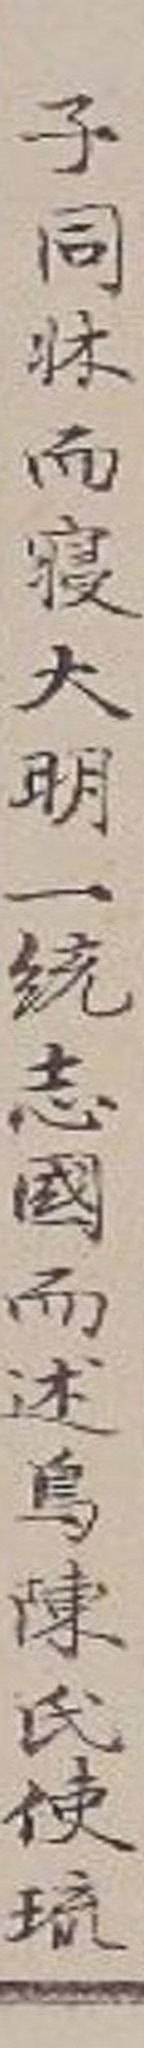子同牀而寝大明一統志国而述焉陳氏使琉

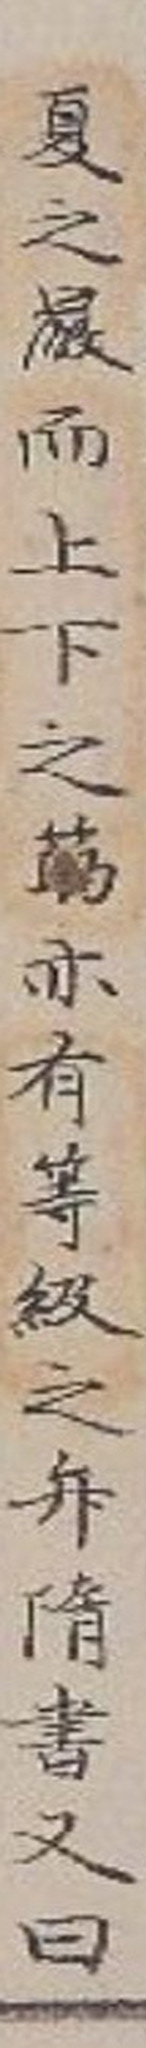夏之而上下之亦有等級之弁隋書又曰
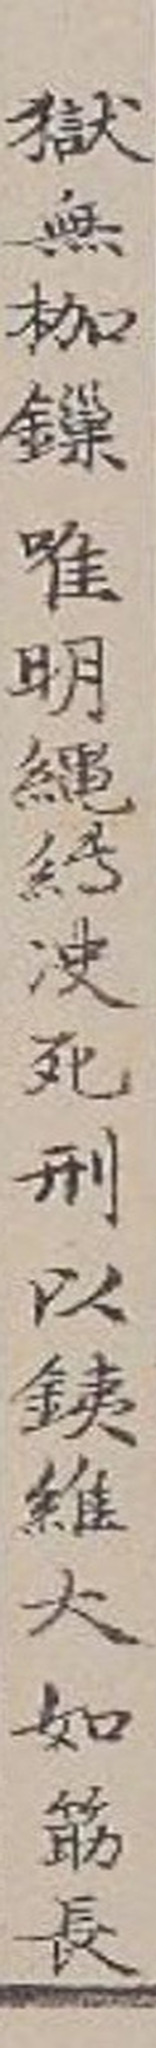獄無枷鏁唯明繩縛死刑以鉄維大如筯長
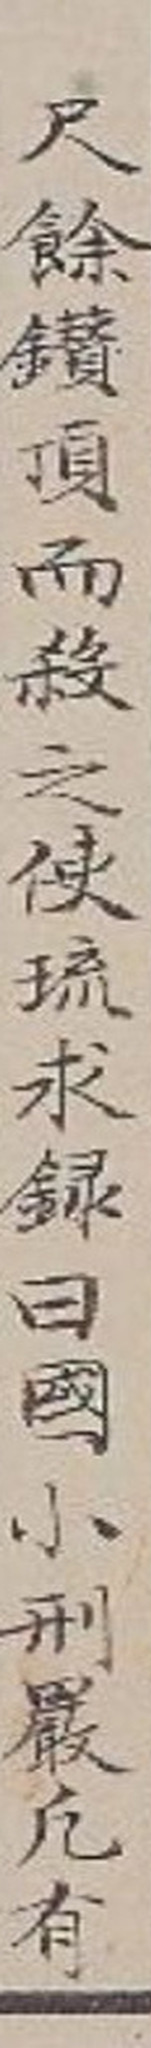尺余鑽頂而殺之使琉求録曰国小刑厳凡有
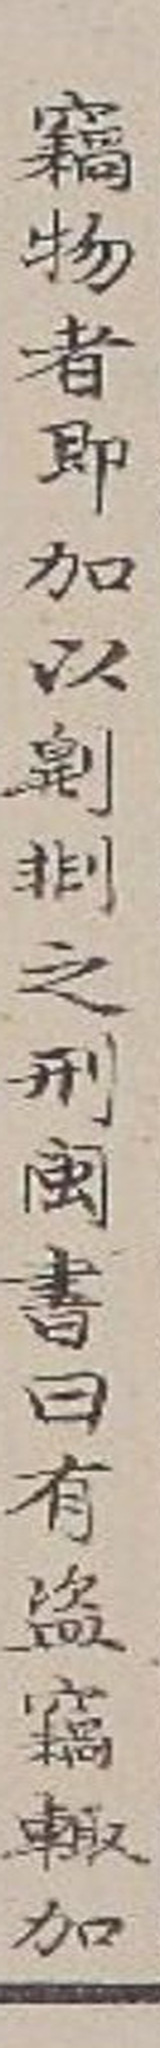竊物者即加以劓剕之刑閩書曰有盜竊輙加
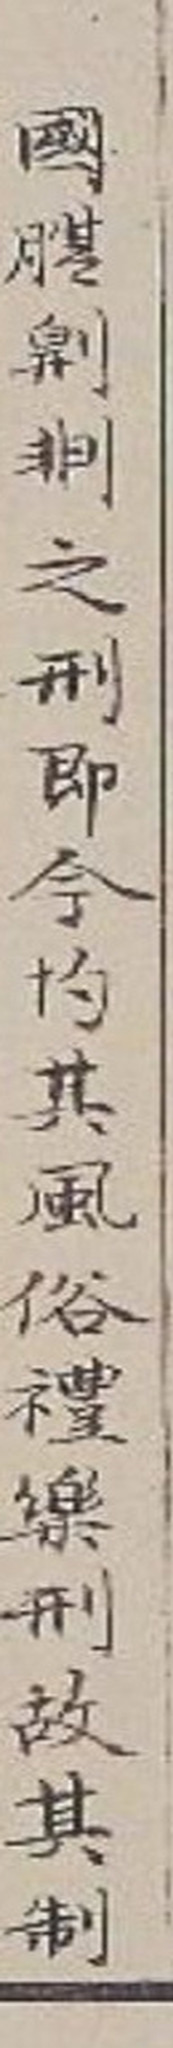国腹劓剕之刑即今其風俗礼楽刑故其制
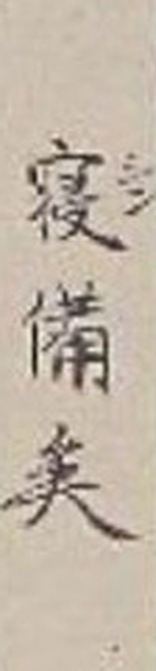寝備矣
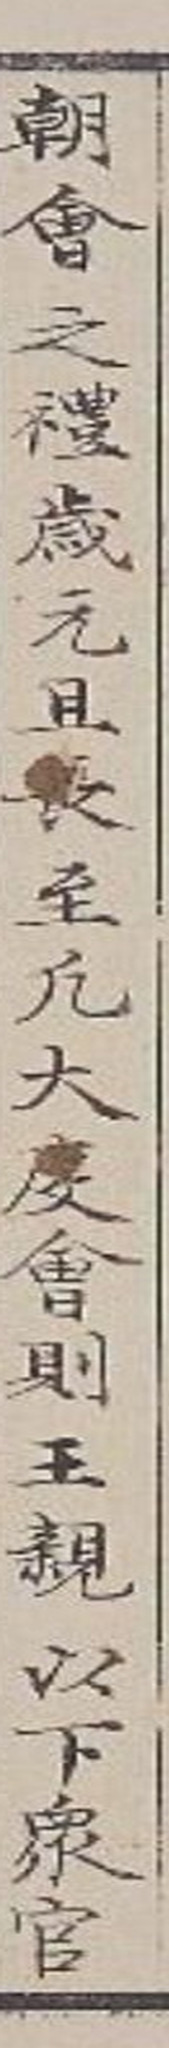朝会之礼歳元旦長至凡大慶会則王親以下衆官
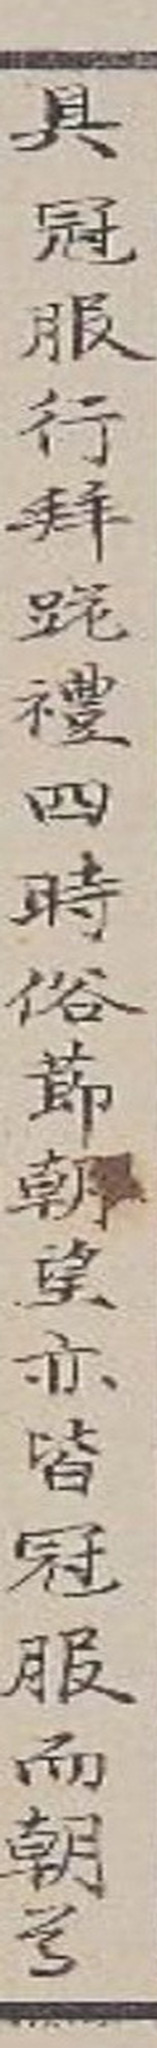具冠服行拝跪礼四時俗節朝望亦皆冠服而朝尊
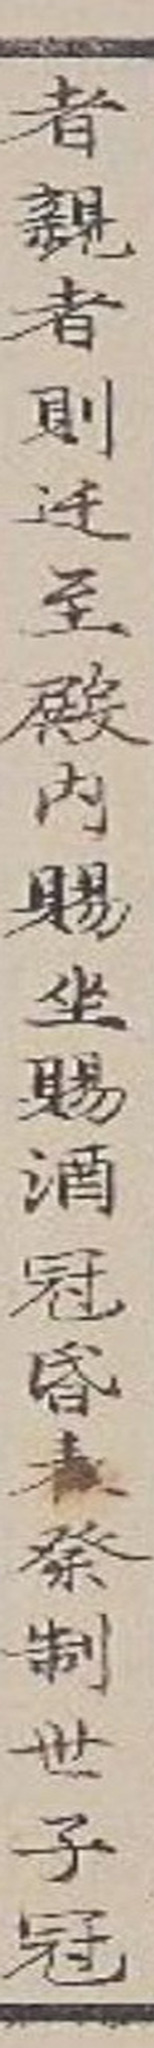者親者則至殿内賜坐賜酒冠昏表祭制世子冠
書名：南島志 全
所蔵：University of the Ryukyus Library
